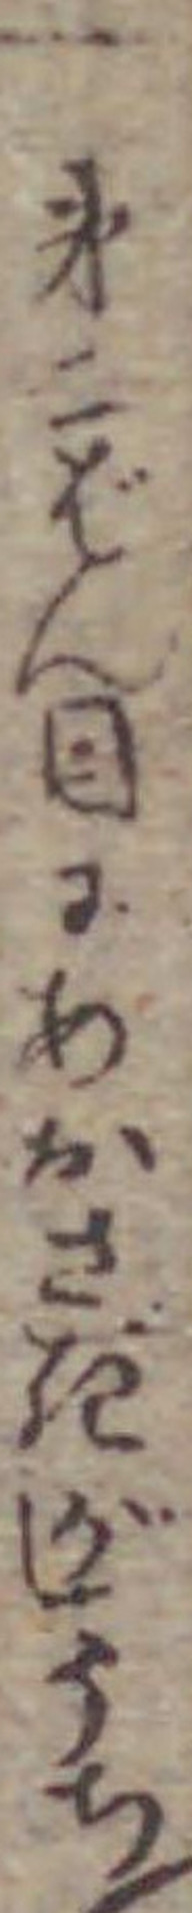第二ばん目にあおさきがしうち
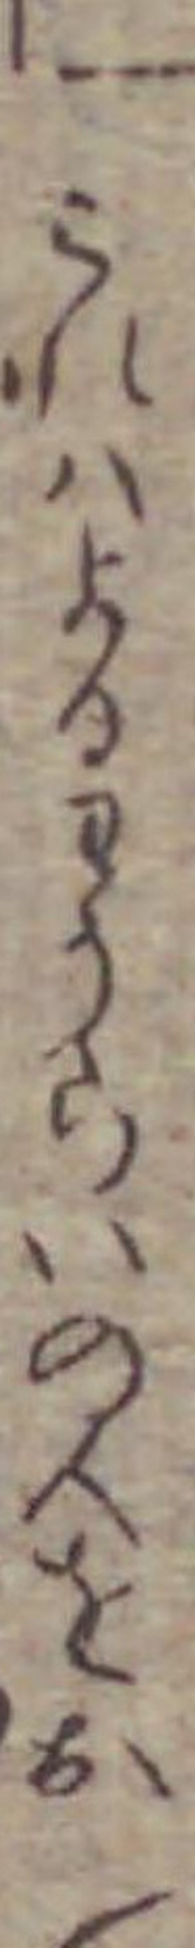これはよるわうらいの人をお
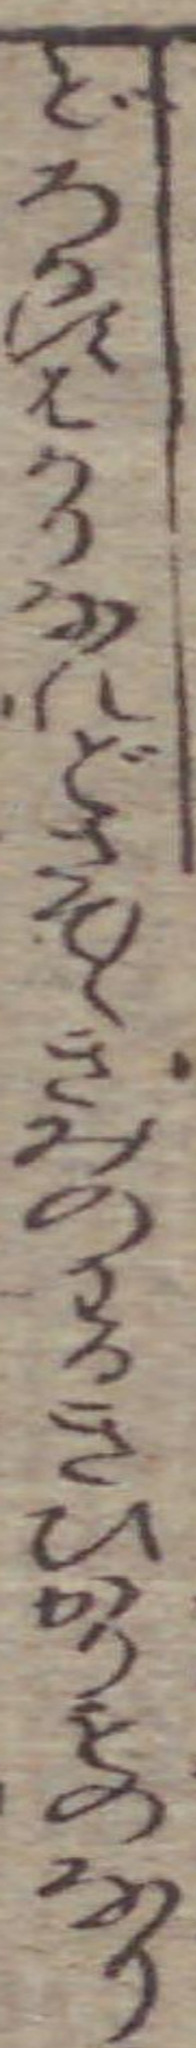どろかすはかりなれどさて〳〵きみのわるきひかりものなり
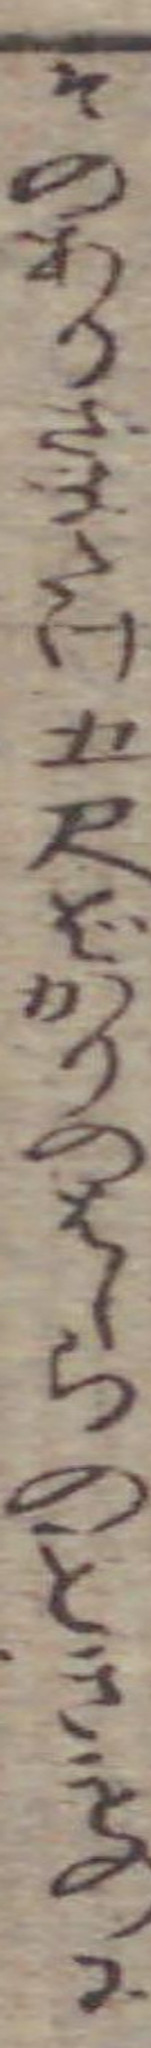そのありさまたけ五尺ばかりのはしらのこときものに
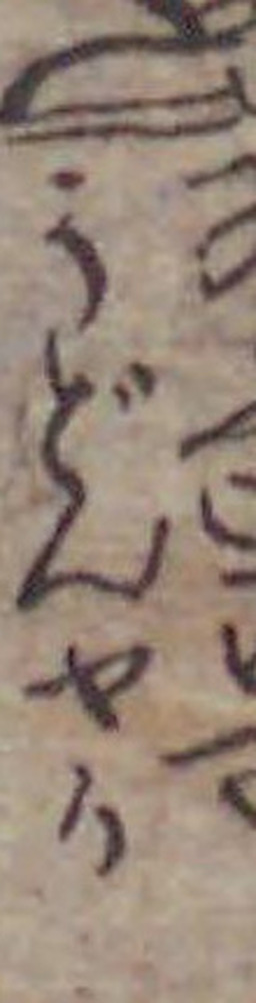うどんやか
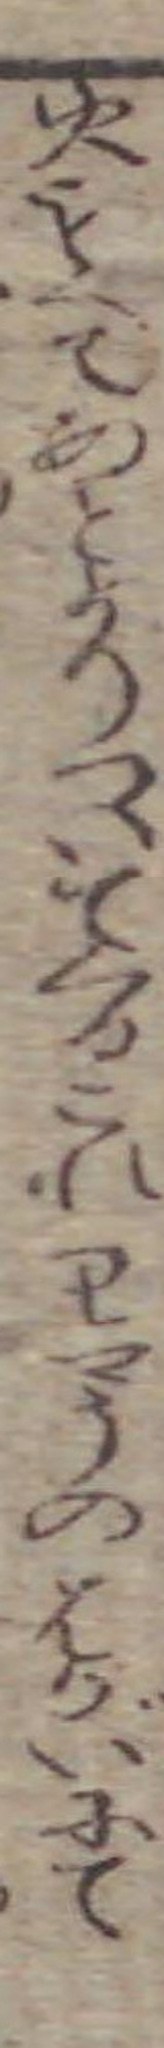火もへてあとよりついてくるこれりやうのはがいにて
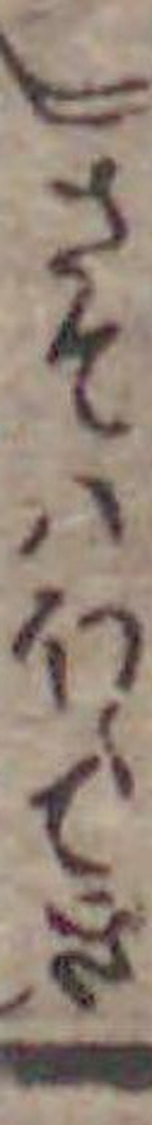さてはほくてき
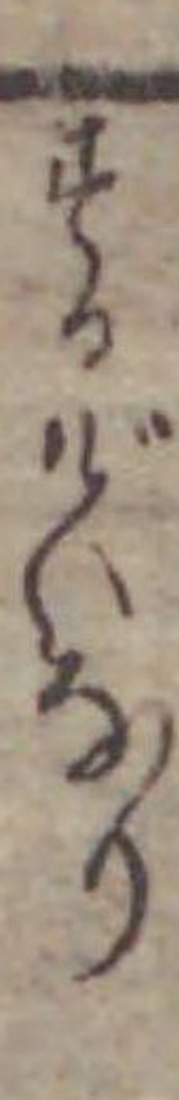するげいなり
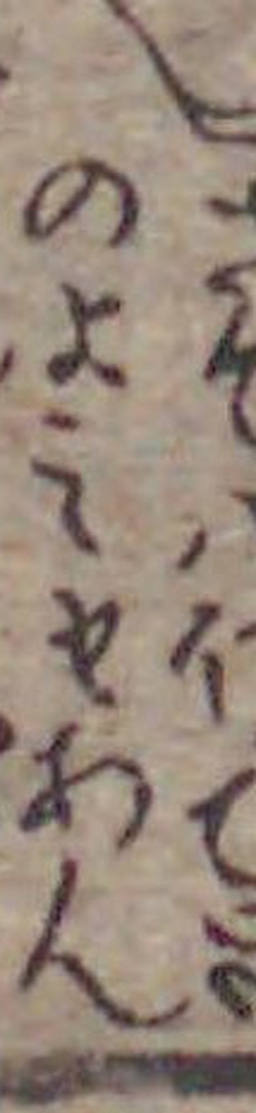のよみせあん
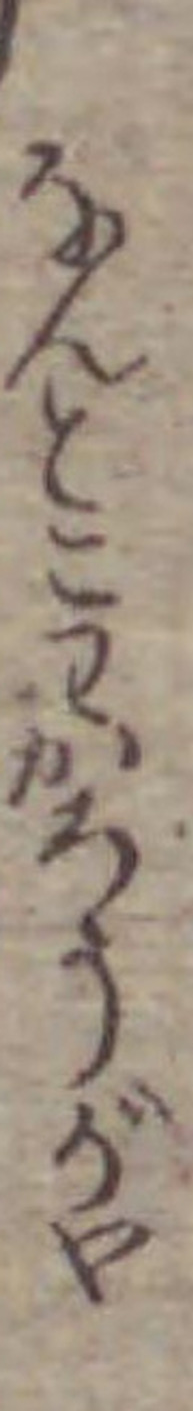なんとこわかろうがや
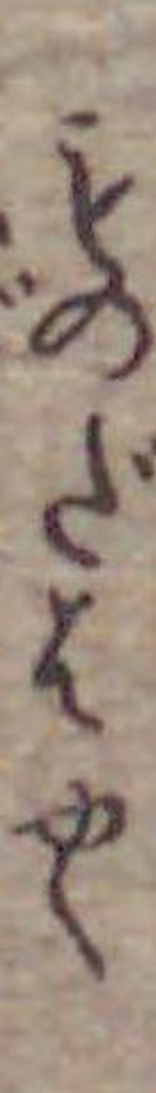ものだはやく
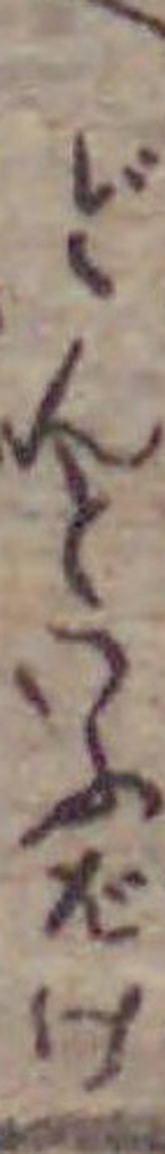どんといふばけ
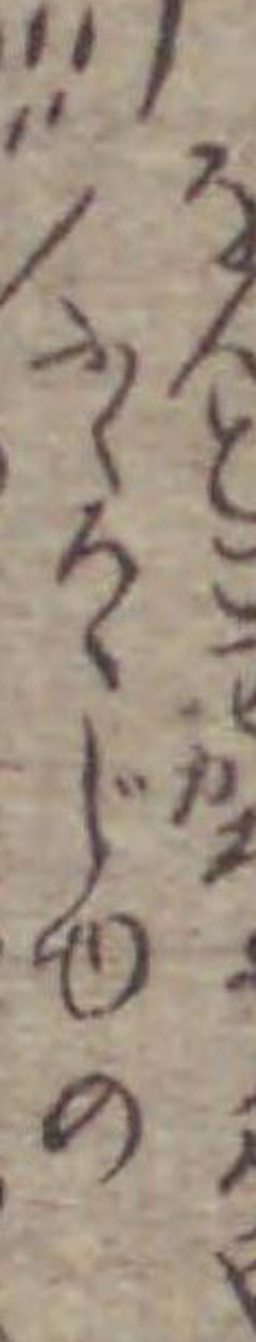ふくろくじゆの
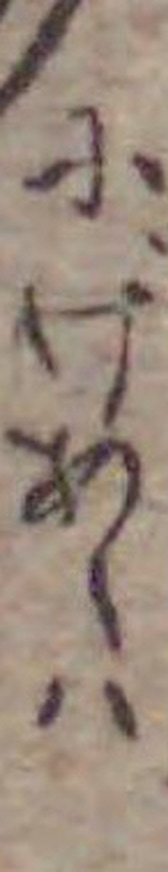にげあしは
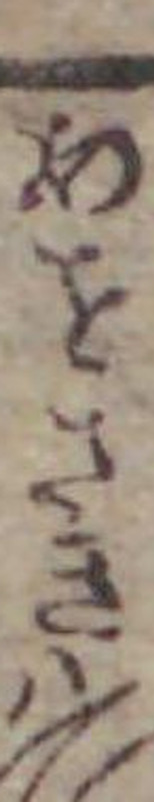あをさきは
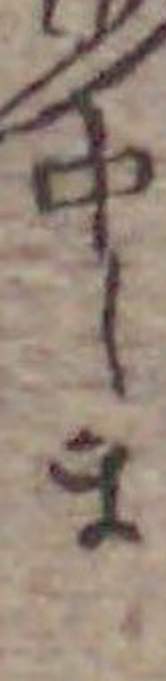中しま
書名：妖怪仕内評判記 : 2巻
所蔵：国立国会図書館 National Diet Library, JAPAN
